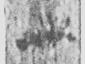卌
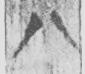八
